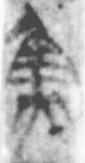魚
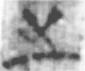之
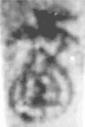聶（攝）
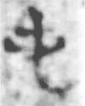屯
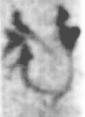狐
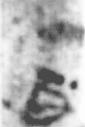白
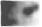之
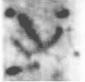聶（攝）
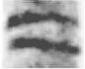二
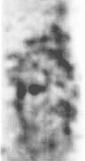○（秦）
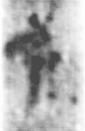弓
